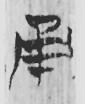甬
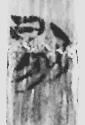{昜刀}
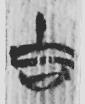吉
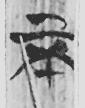不
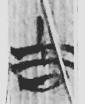吉
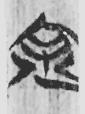余
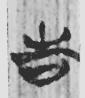告
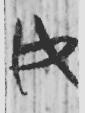女
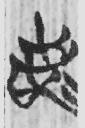若
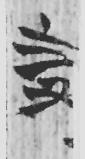寺
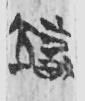{立畤}
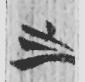之
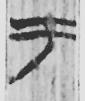于
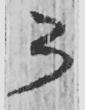乃
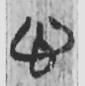心
